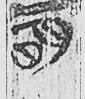明
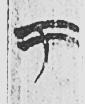于
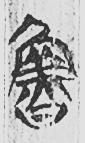魯
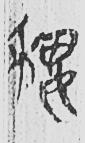稷
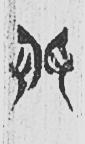門
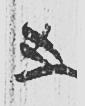之
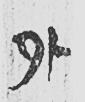外
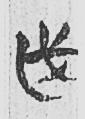戉
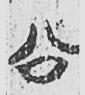公
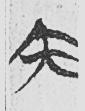內
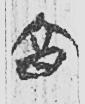亯
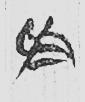於
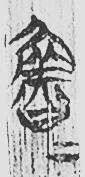魯=
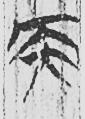侯
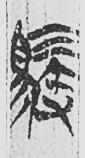馭
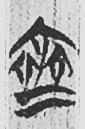齊
